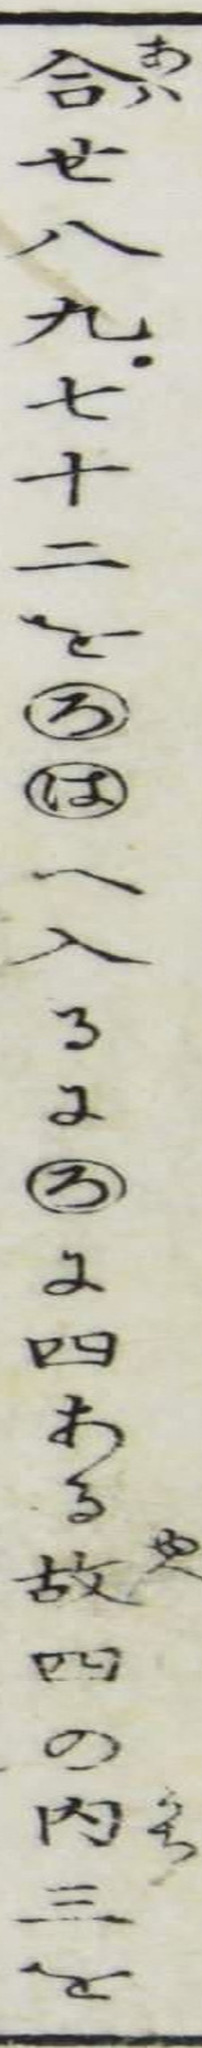合せ八九．七十二を㋺㋩へ入るに㋺に四ある故四の内三を
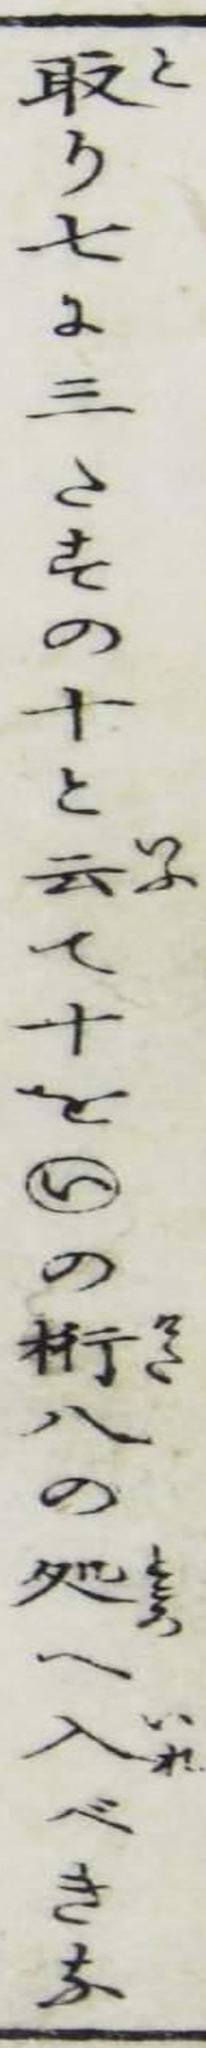取り七に三たすの十と云て十を㋑の桁八の処へ入べきな
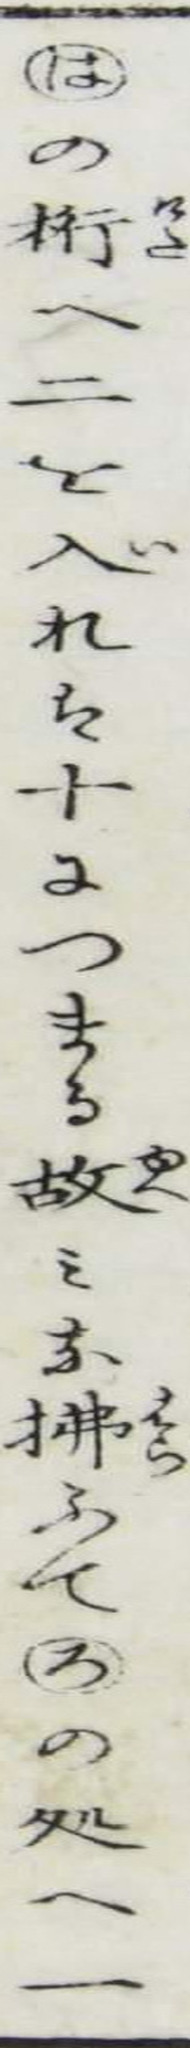㋩の桁へ二を入れは十につまる故みな払ふて㋺の処へ一
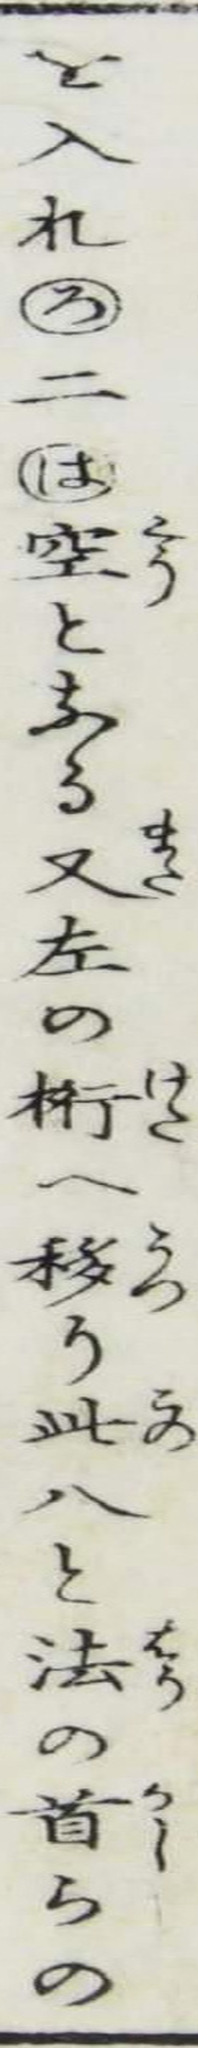を入れ㋺二㋩空となる又左の桁へ移り此八と法の首らの
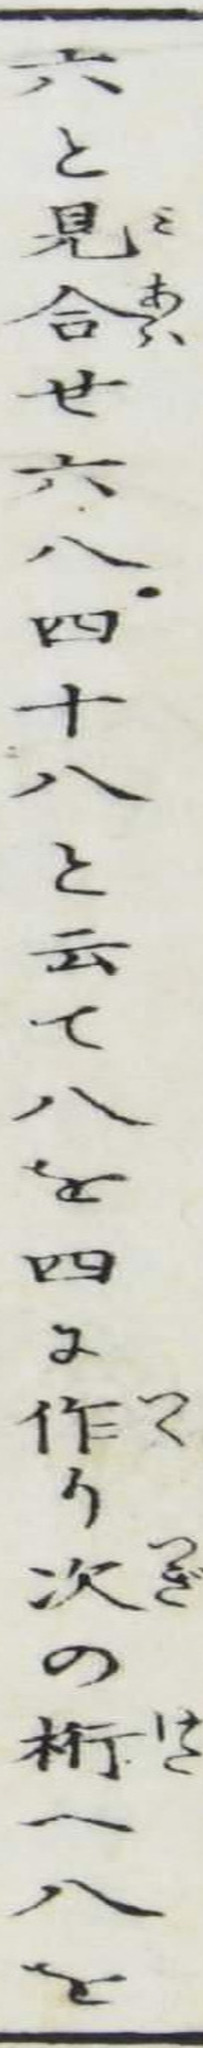六と見合せ六八．四十八と云て八を四に作り次の桁へ八を
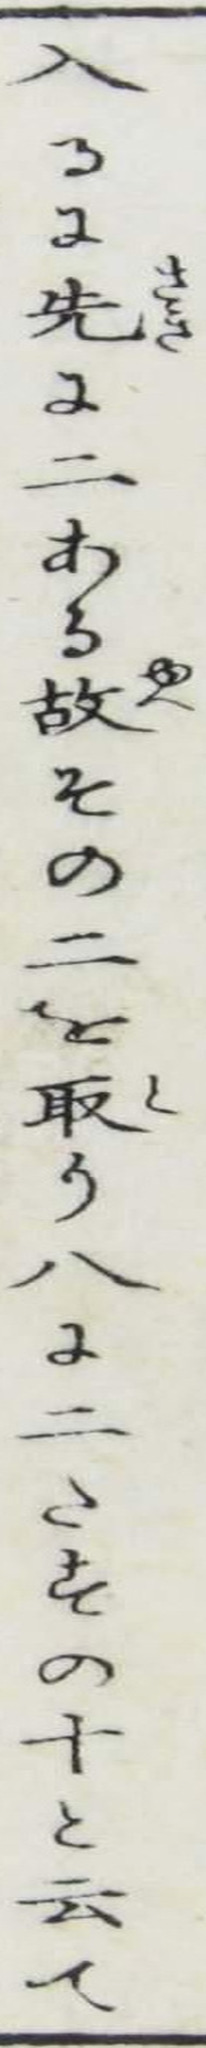入るに先に二ある故その二を取り八に二たすの十と云て
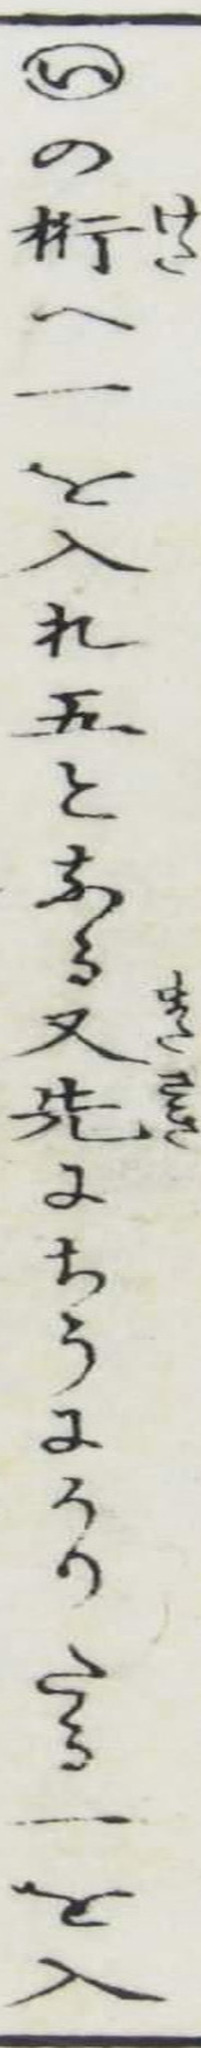㋑の桁へ一を入れ五となる又先にちうにかりたる一を入
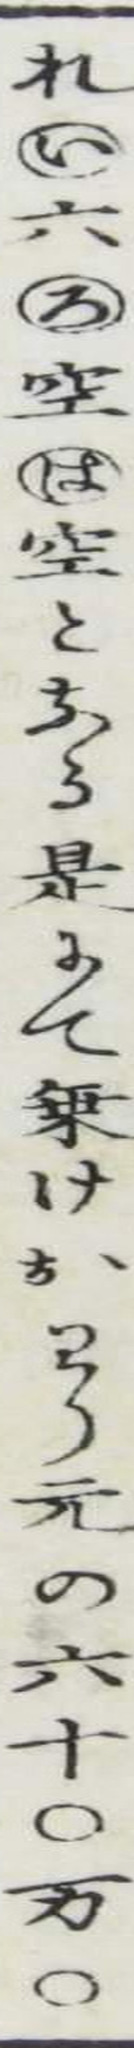れ㋑六㋺空㋩空となる是にて乗けおわり元の六十〇万〇
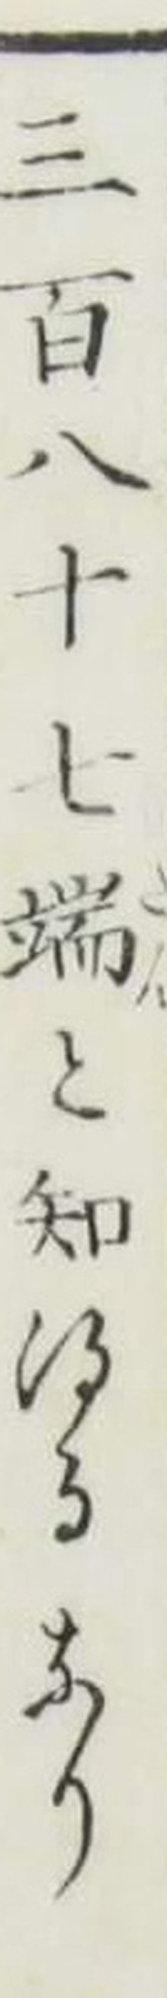三百八十七端と知得るなり
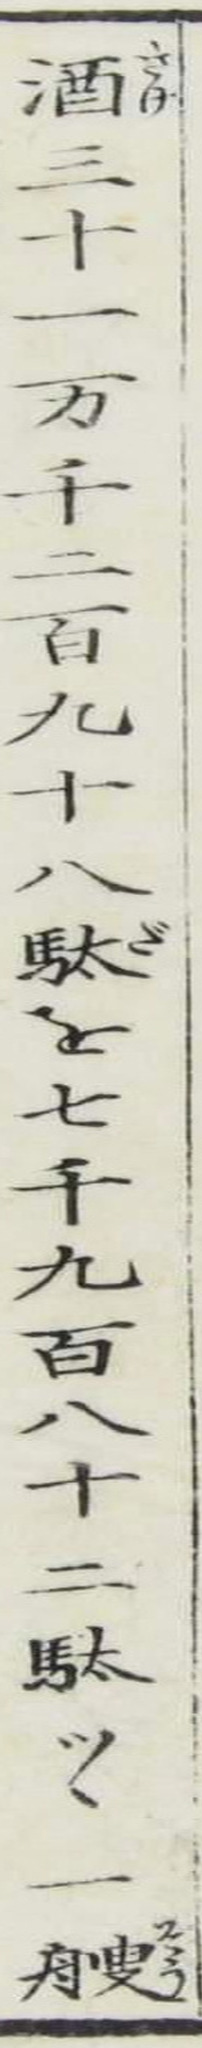酒三十一万千二百九十八駄を七千九百八十二駄ツヽ一艘
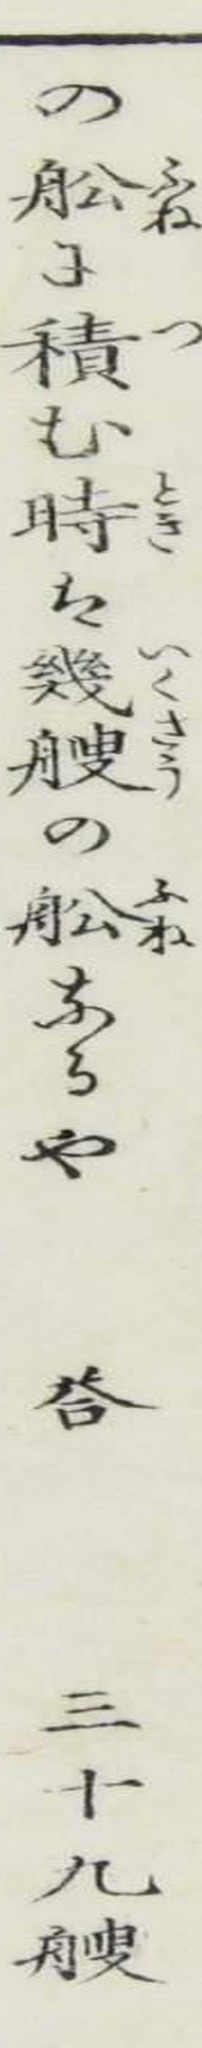の船に積む時は幾艘の船なるや答三十九艘
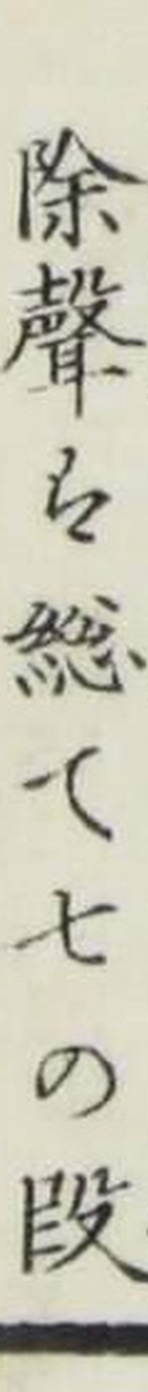除声は総て七の段
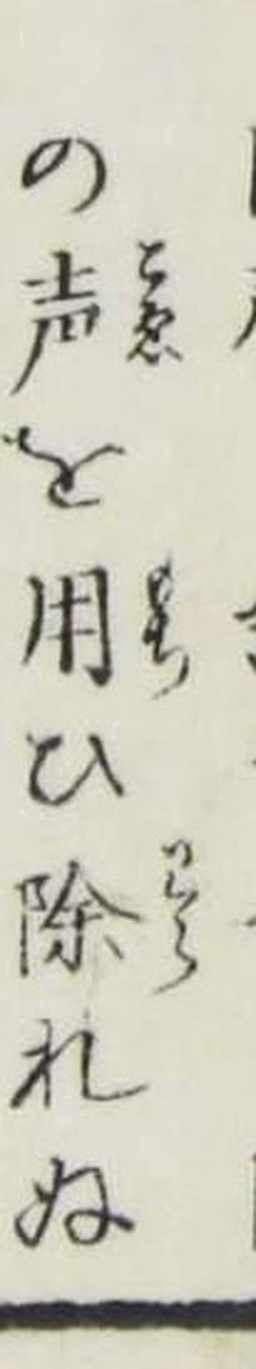の声を用ひ除れぬ
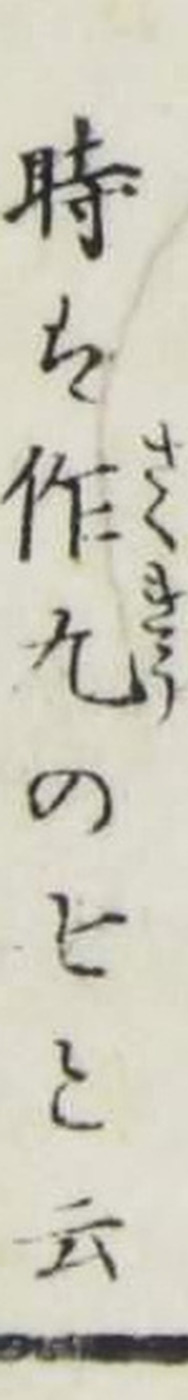時は作九の七と云
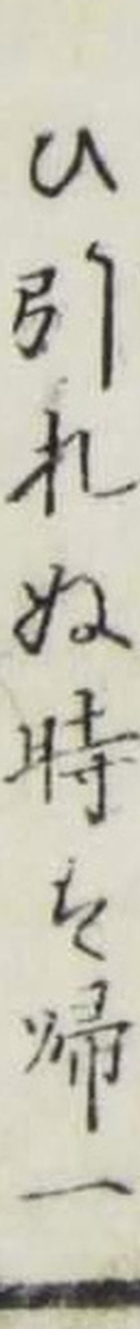ひ引れぬ時は帰一
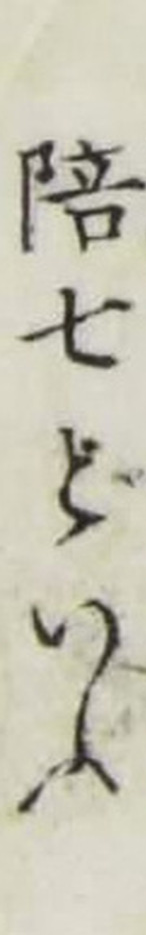陪七といふ
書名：明治小學塵劫記 卷1
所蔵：東京学芸大学教育コンテンツアーカイブ
